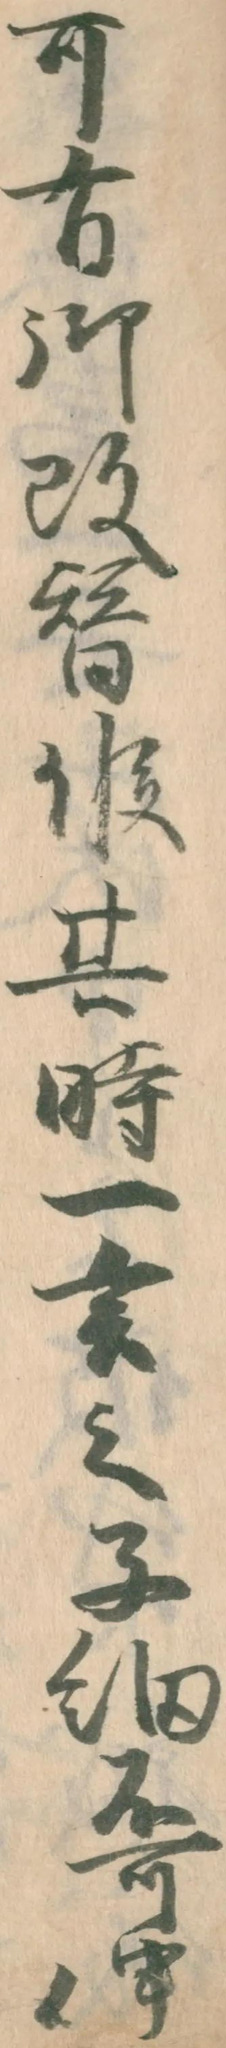可有御改替候其時一言之子細不可申候
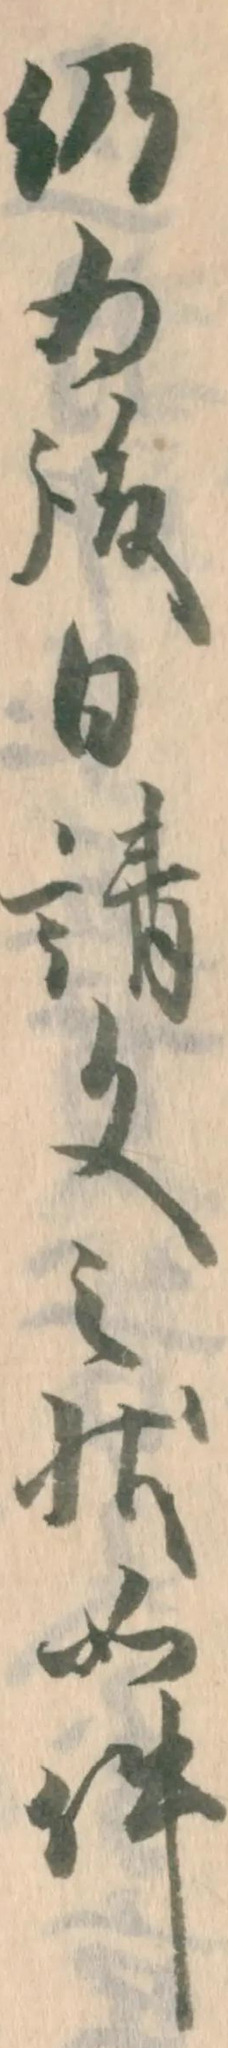仍為後日請文之状如件
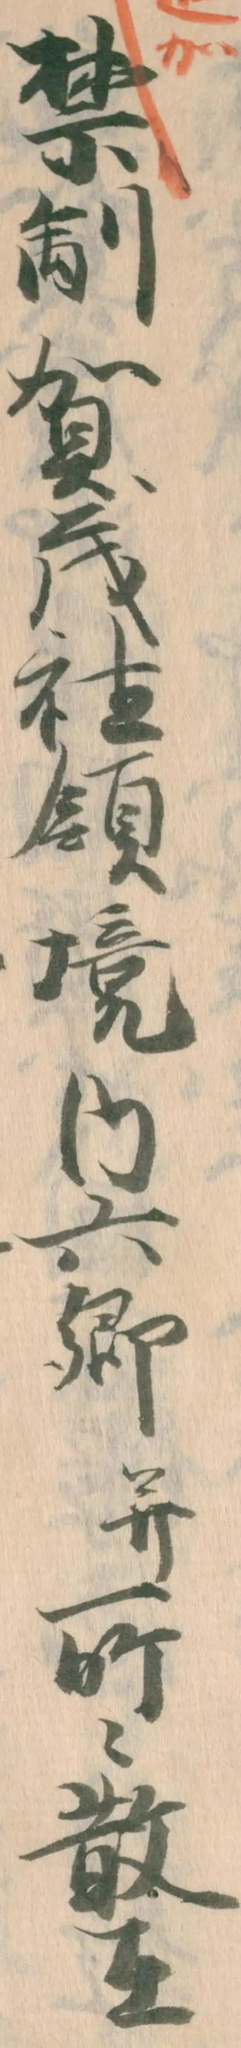禁制賀茂社領境内六郷并所々散在
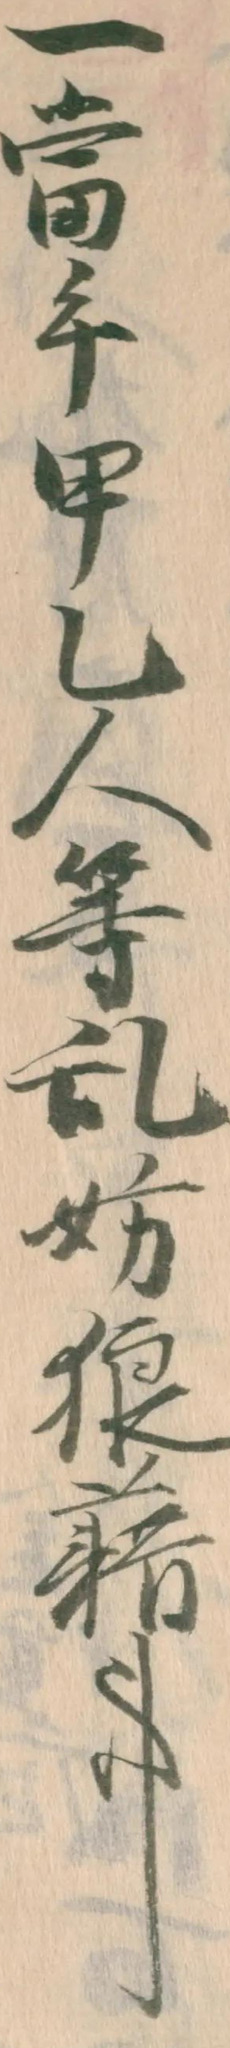一当手甲乙人等乱妨狼藉事
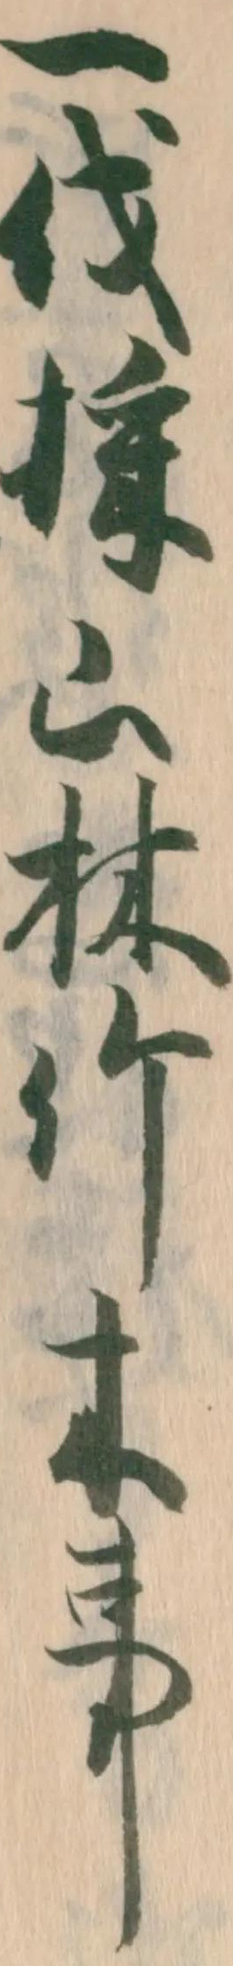一伐採山林竹木事
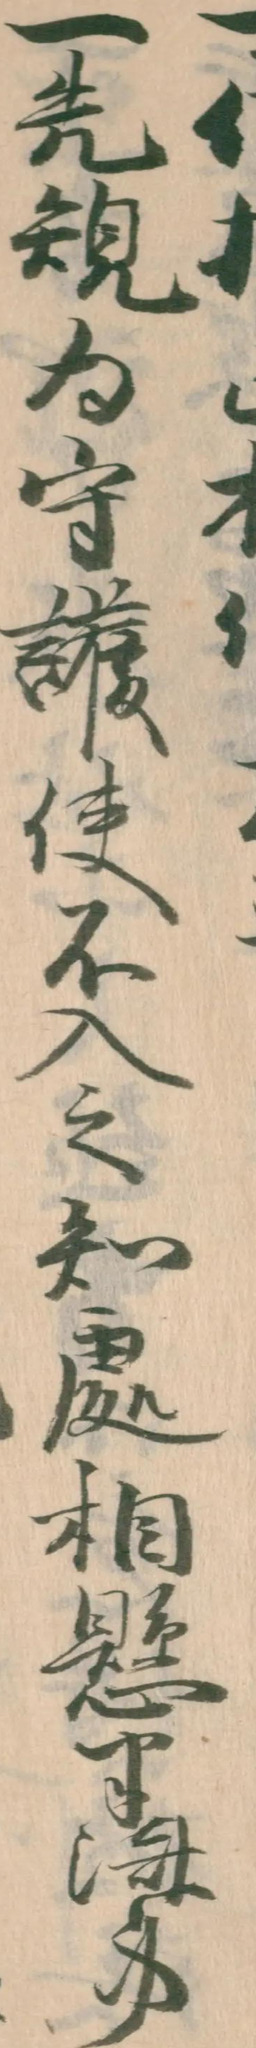一先規為守護使不入之知処相懸半済事
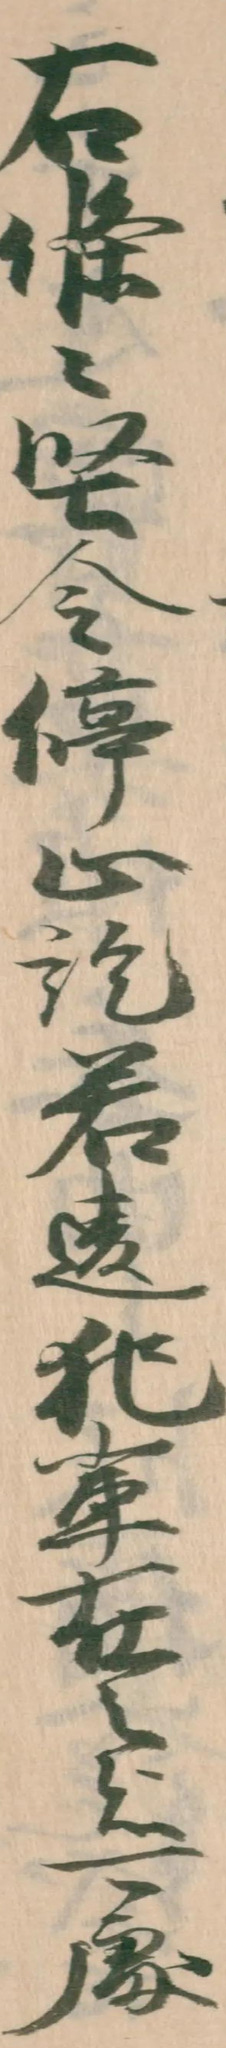右条々堅令停止訖若違犯輩在之者可処
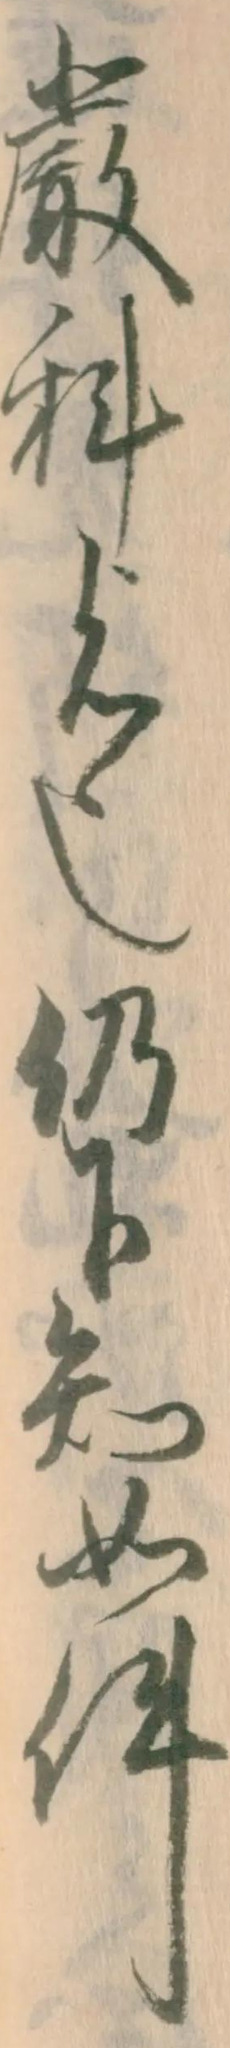厳科者也仍下知如件
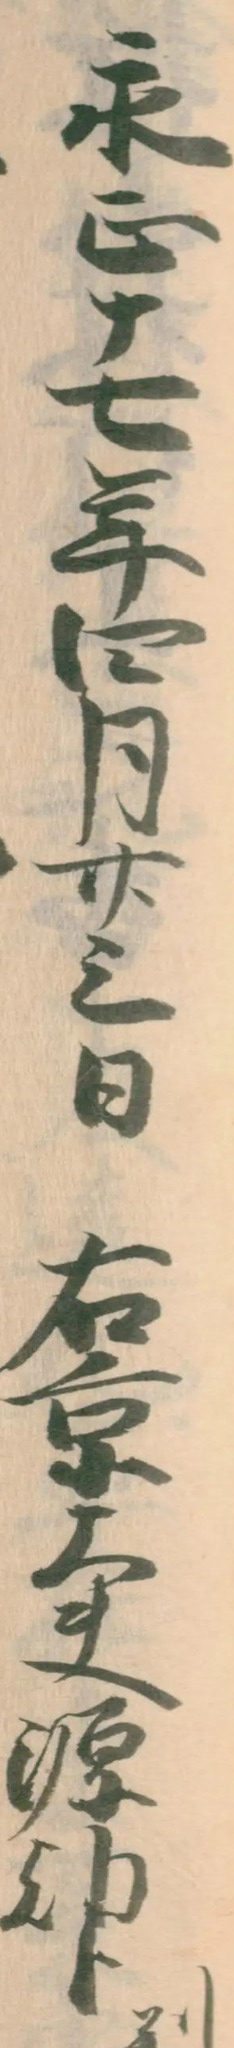永正十七年四月廿三日右京大夫源朝臣判
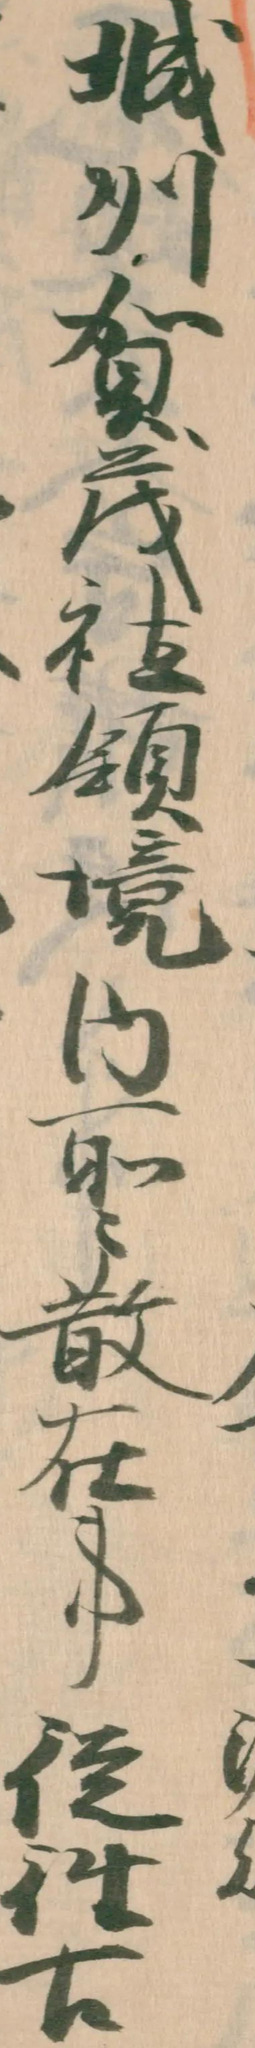城州賀茂社領境内所々散在事従往古
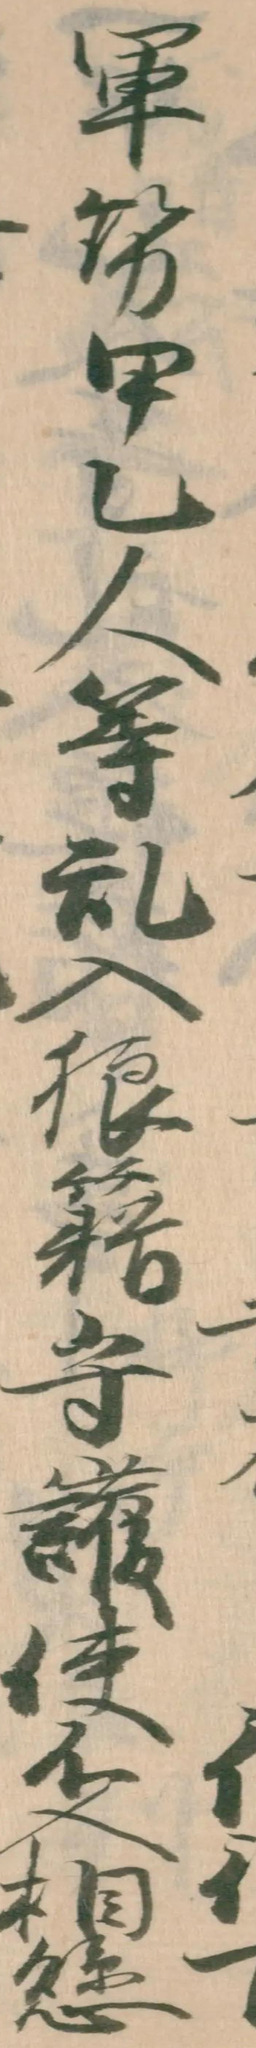軍勢甲乙人等乱入狼藉守護使不入相懸
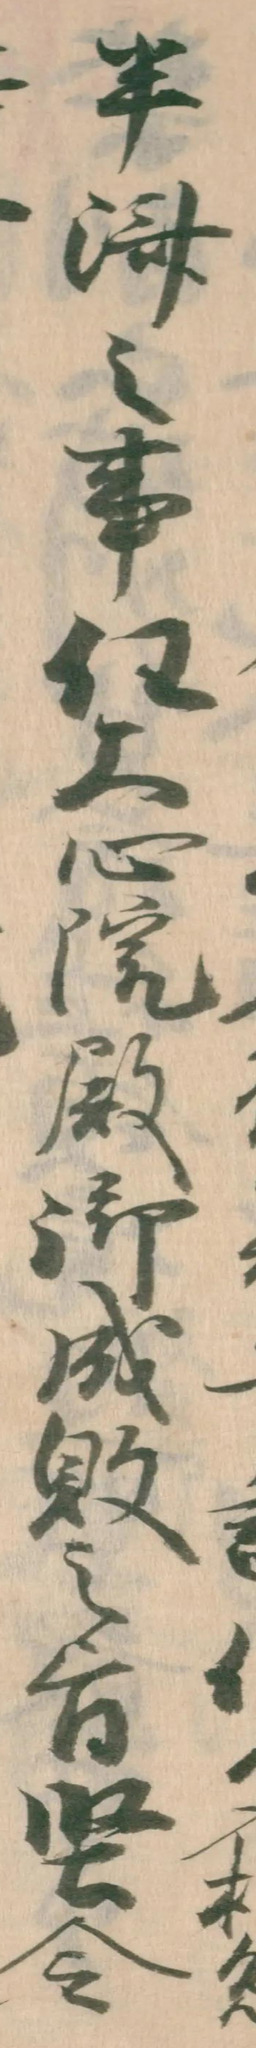半済之事任大心院殿御成敗之旨堅令
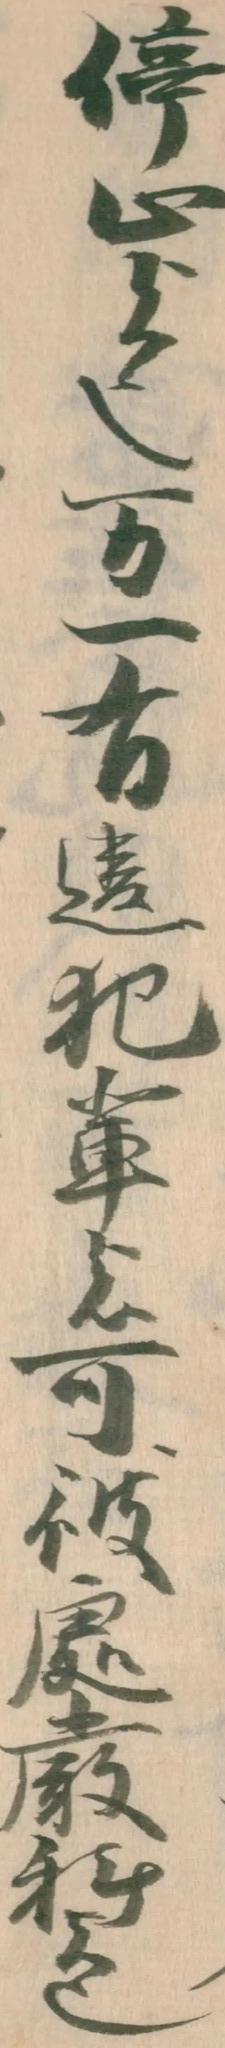停止者也万一有違犯輩者可被処厳科者也
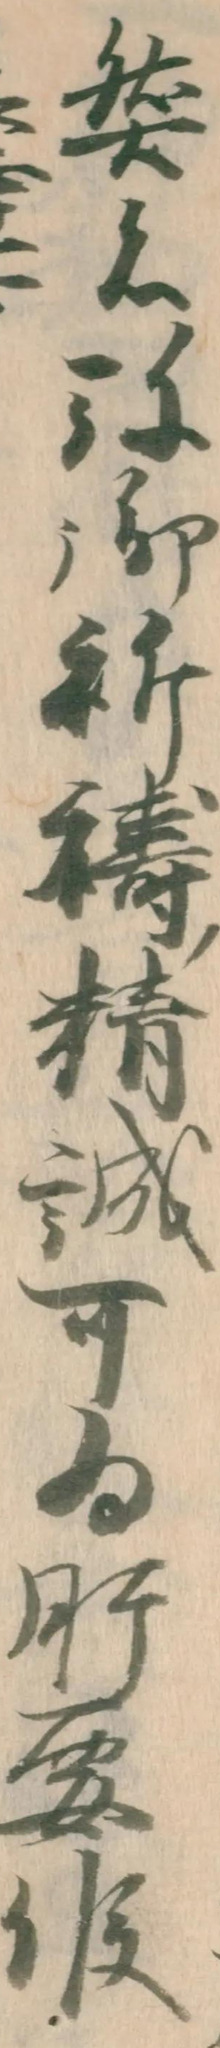然者弥御祈祷精誠可為肝要候
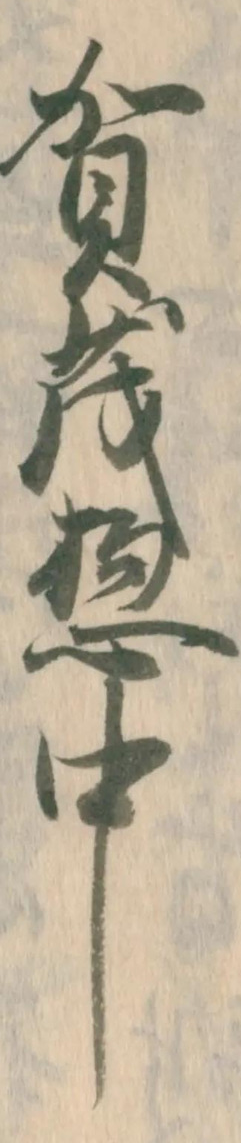賀茂惣中
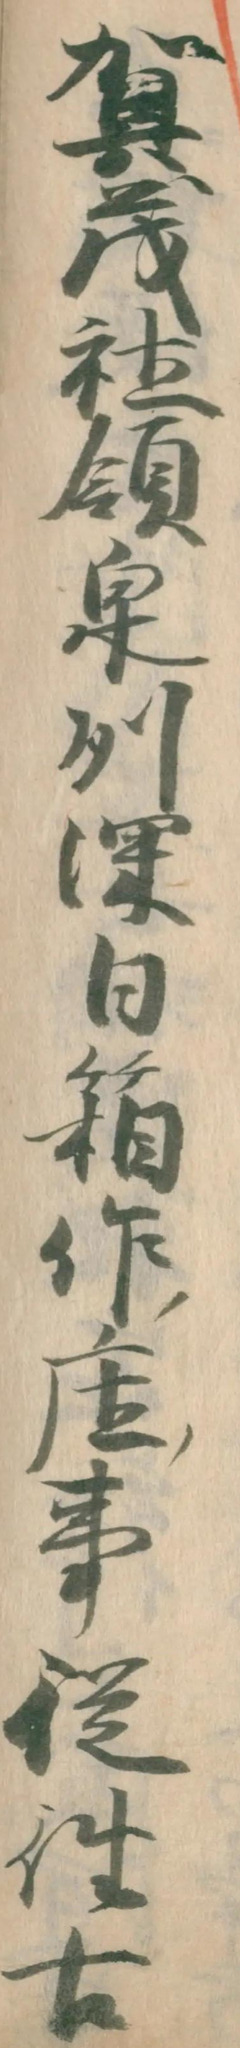賀茂社領泉州深日箱作庄事従往古
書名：賀茂社記録. 第1冊
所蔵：国立国会図書館 National Diet Library, JAPAN
